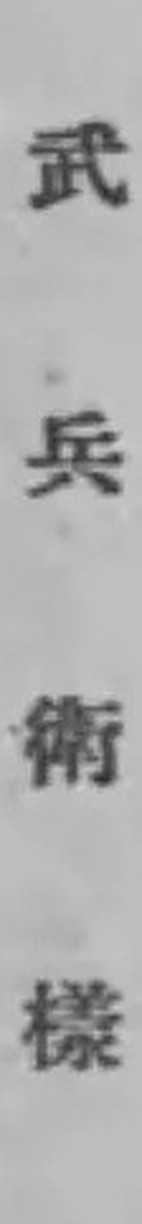武兵衛様
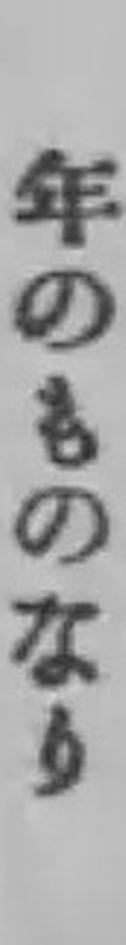年のものなり
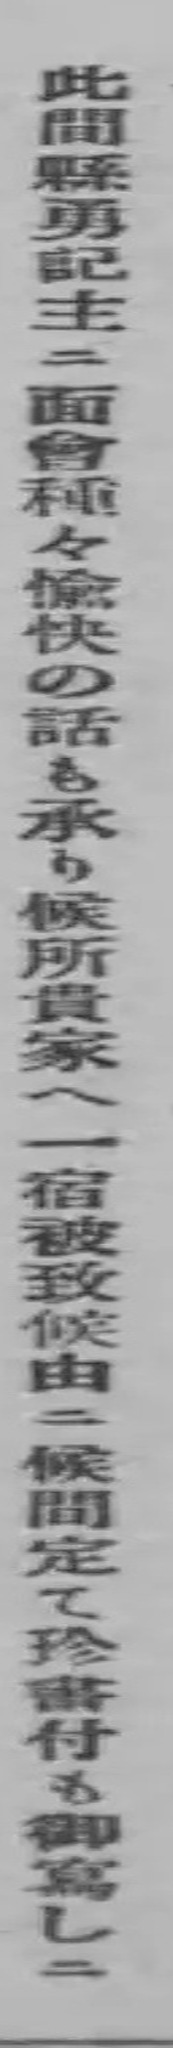此間縣勇記主ニ面会種々愉快の話も承り候所貴家へ一宿被致候由ニ候間定て珍書付も御写しニ
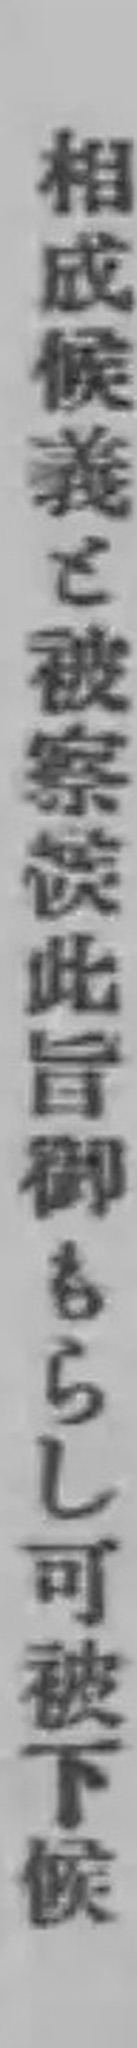相成候義と被察候此旨御もらし可被下候
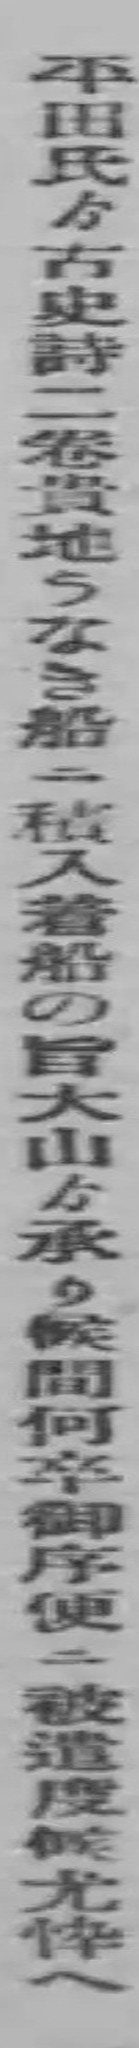平田氏ゟ古史詩二巻貴地うなき船ニ積入着船の旨大山ゟ承り候間何卒御序便ニ被遣度候尤忰へ
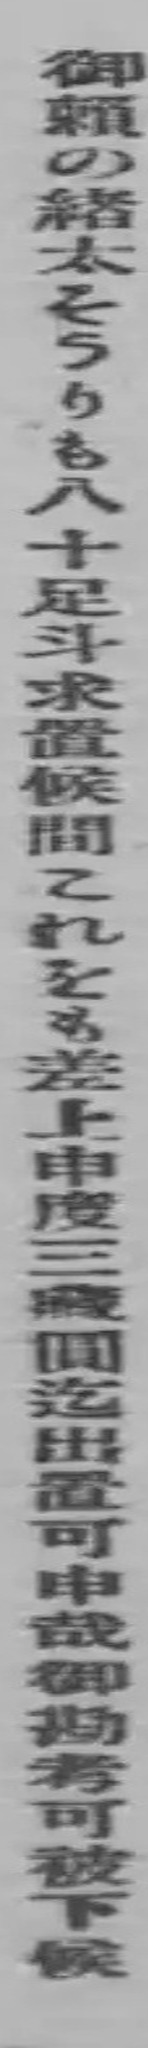御頼の諸太そうりも八十足斗求置候間これをも差上申度三藏円迄出置可申哉御勘考可被下候
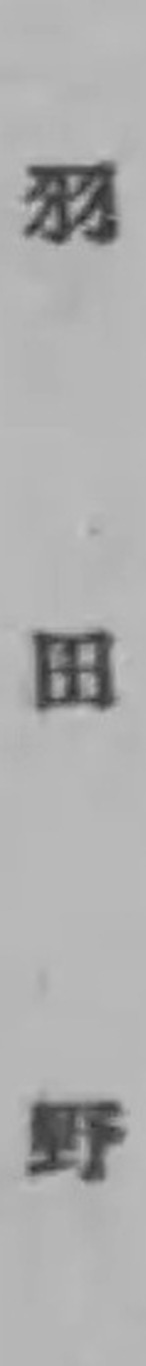羽田野
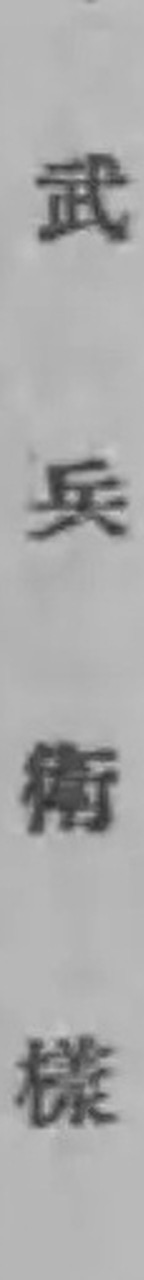武兵衛様

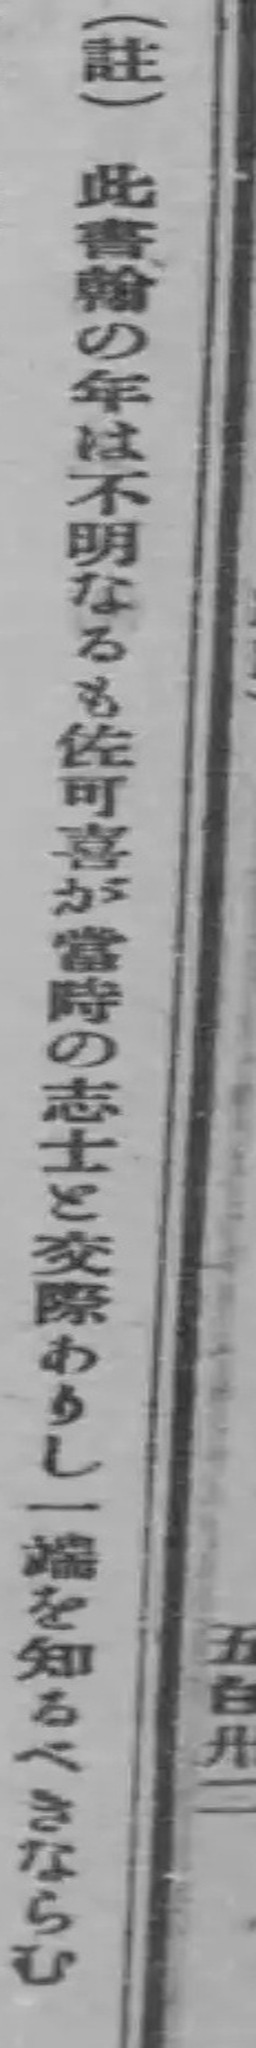(註)此書翰の年は不明なるも佐可喜が当時の志士と交際ありし一端を知るべきならむ
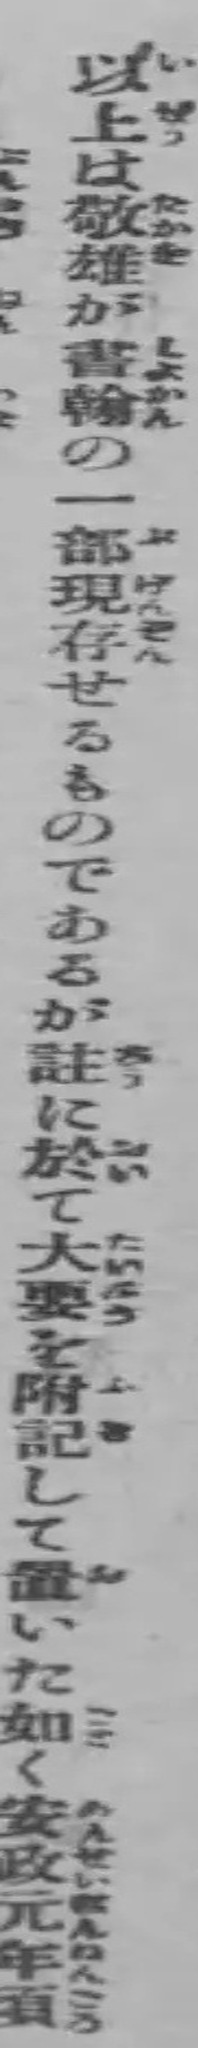以上は敬雄が書翰の一部現存せるものであるが註に於て大要を附記して置いた如く安政元年頃
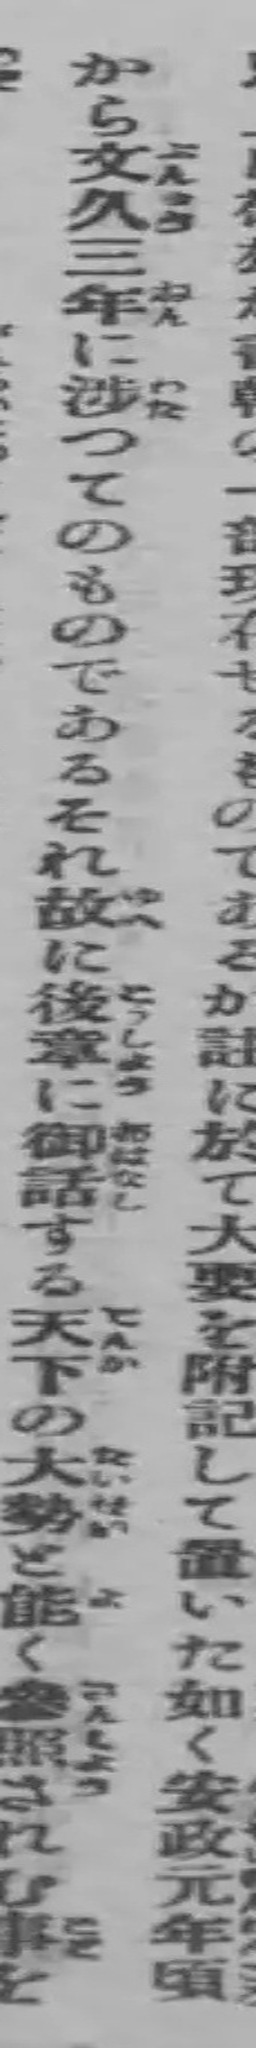から文久三年に渉つてのものであるそれ故に後章に御話する天下の大勢と能く参照されむ事を
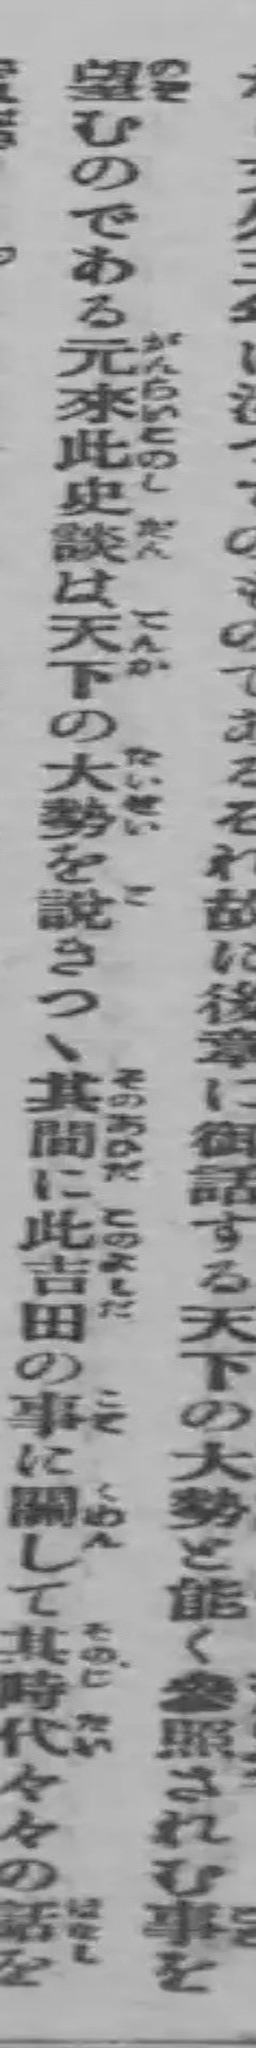望むのである元来此史談は天下の大勢を説きつゝ其間に此吉田の事に関して其時代々々の話を
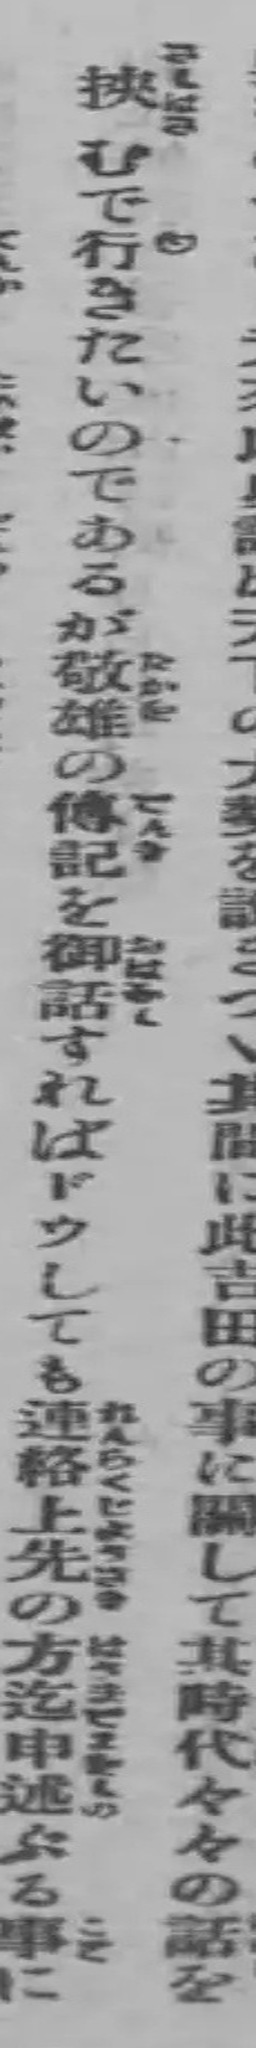挟むで行きたいのであるが敬雄の伝記を御話すればドウしても連絡上先の方迄申述ぶる事に
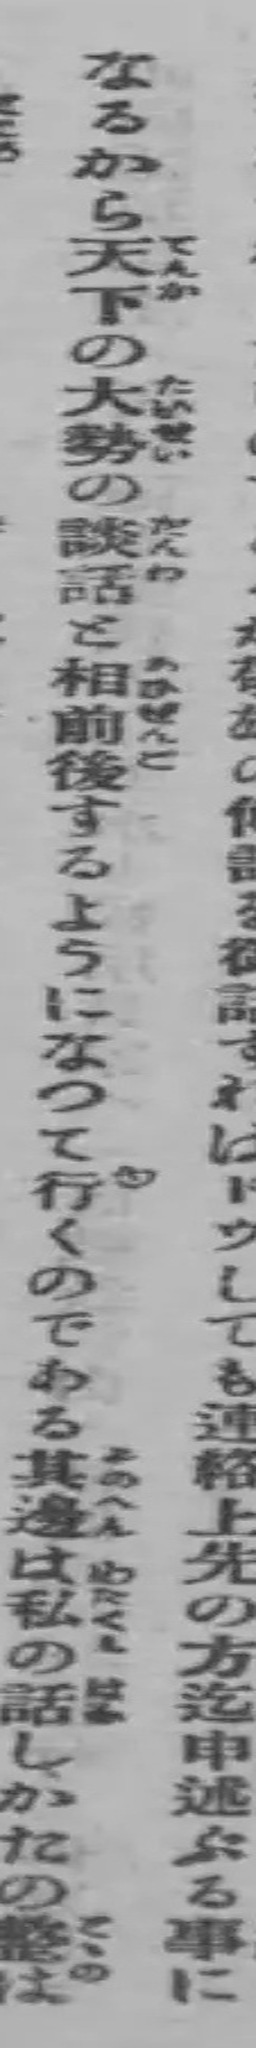なるから天下の大勢の談話と相前後するようになつて行くのである其辺は私の話しかたの整は
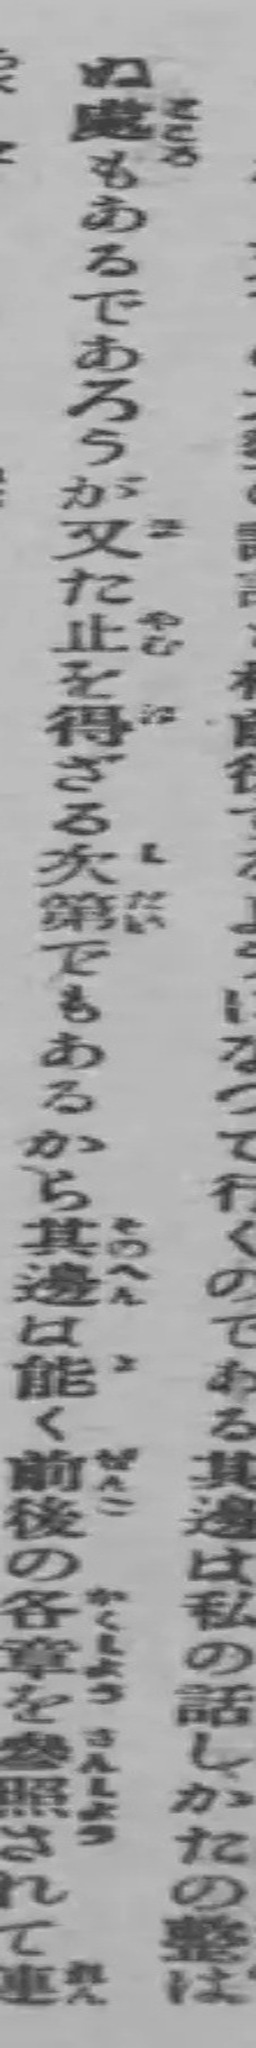ぬ処もあるであろうが又た止を得ざる次第でもあるから其返は能く前後の各章を参照されて連
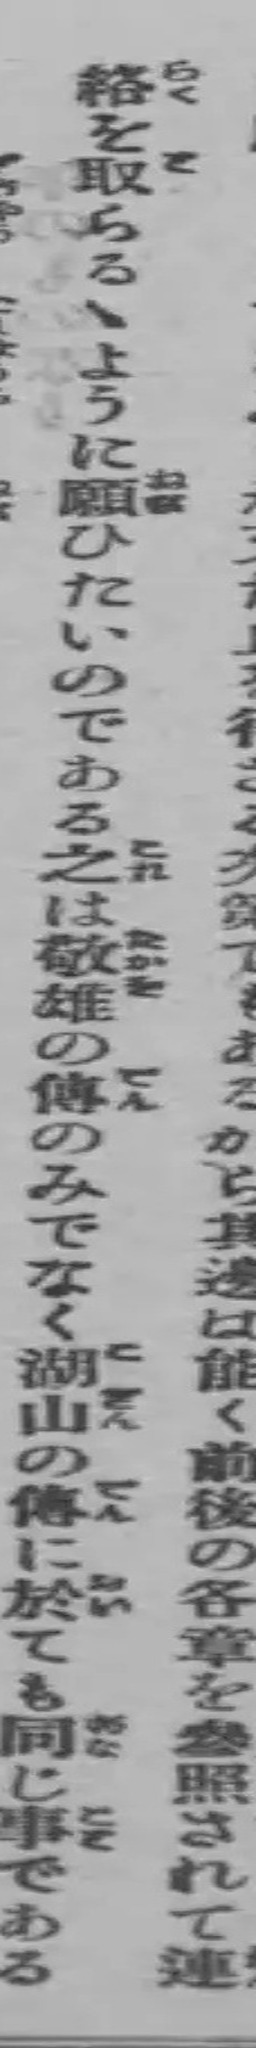絡を取らるゝように願ひたいのである之は敬雄の伝のみでなく湖山の伝に於ても同じ事である
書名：豊橋市史談
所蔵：国立国会図書館 National Diet Library, JAPAN
